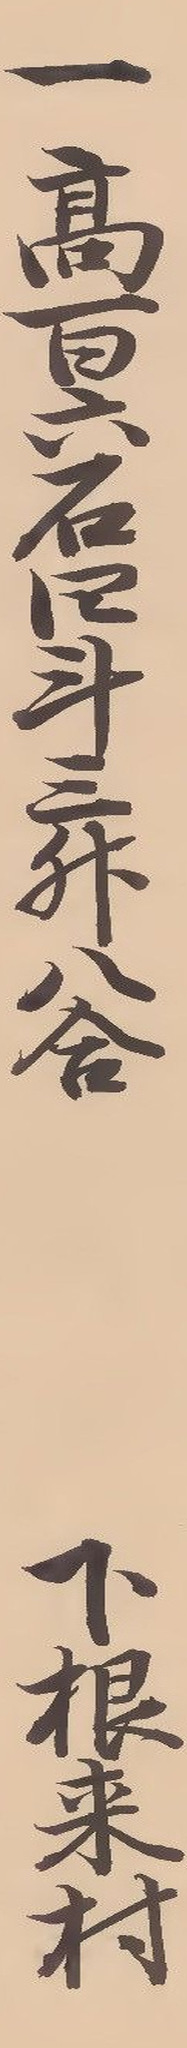一高百六石四斗三升八合下根来村
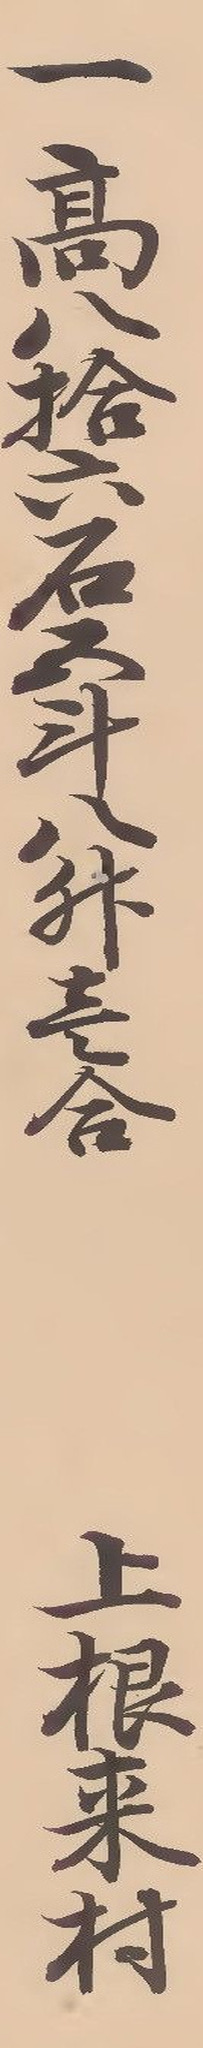一高八拾六石五斗八升壱合上根来村

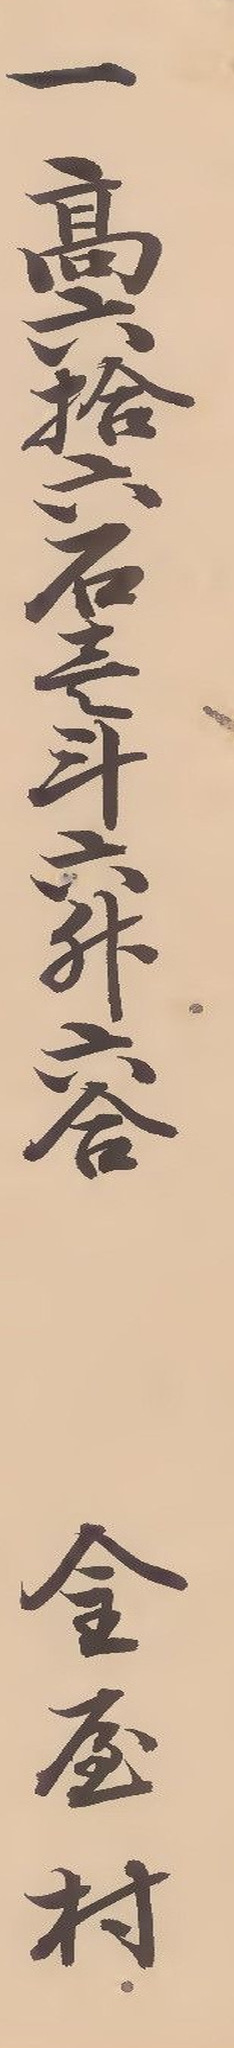一高六拾六石壱斗六升六合金屋村
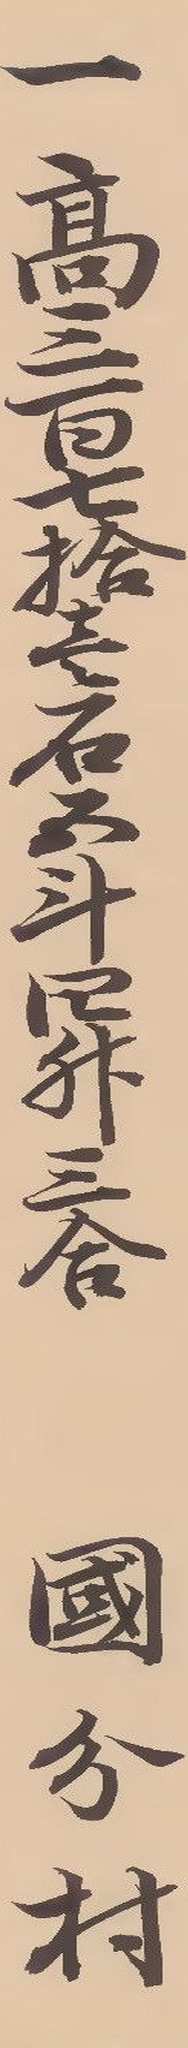一高三百七拾壱石五斗四升三合国分村
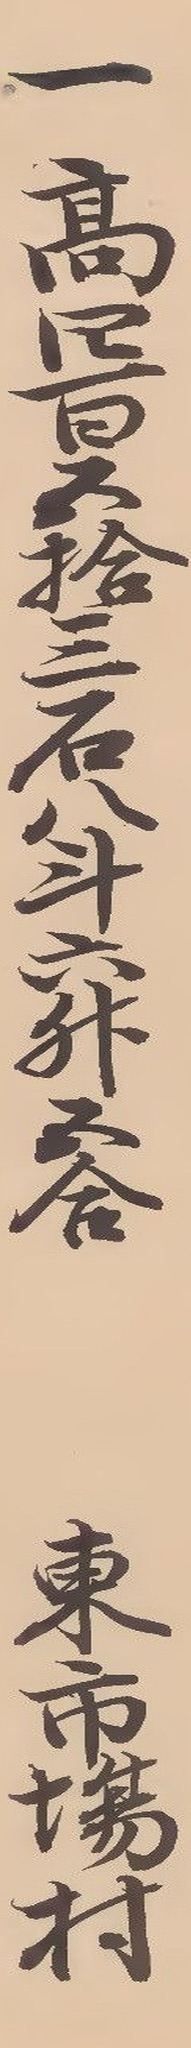一高四百五拾三石八斗六升五合東市場村
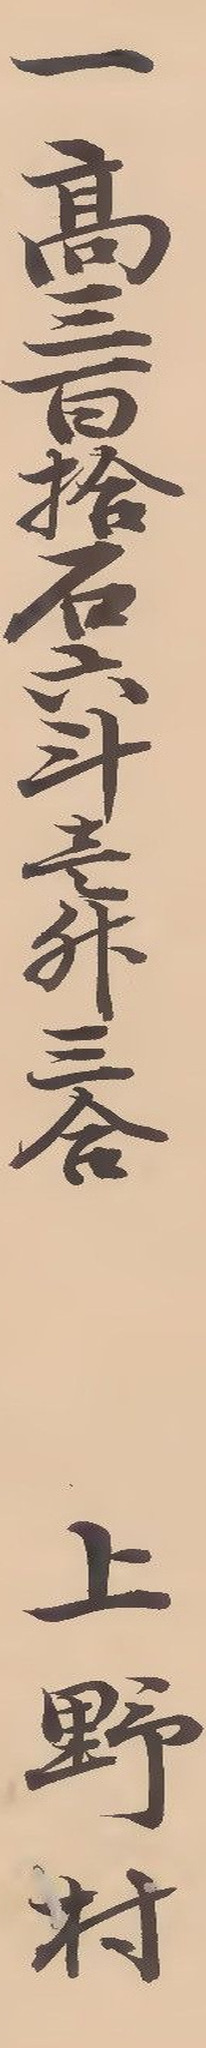一高三百拾石六斗壱升三合上野村
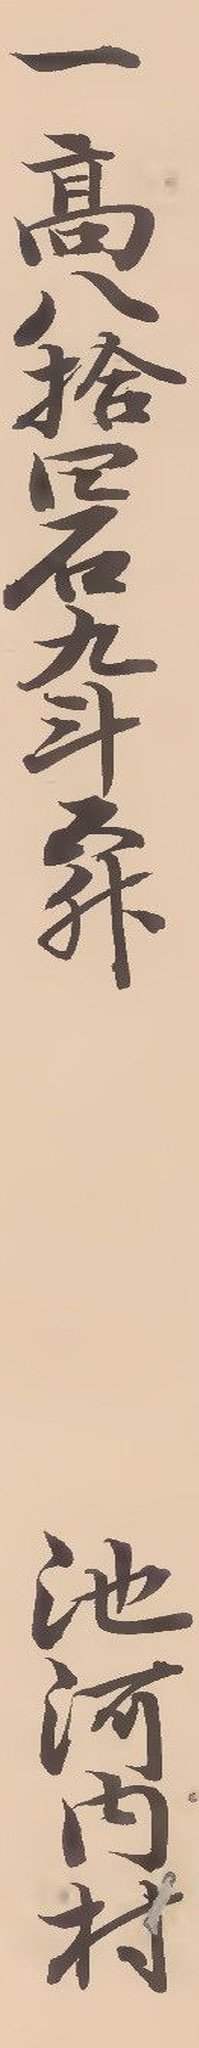一高八拾四石九斗五升池河内村
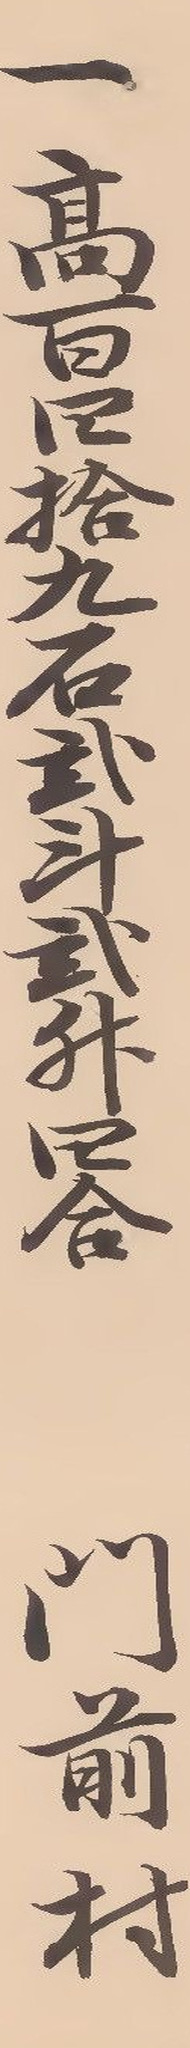一高百四拾九石弐斗弐升四合門前村
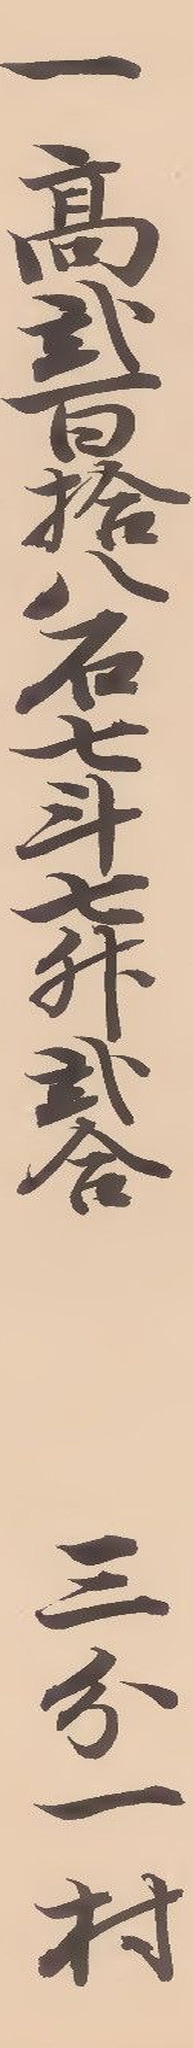一高弐百拾八石七斗七升弐合三分一村
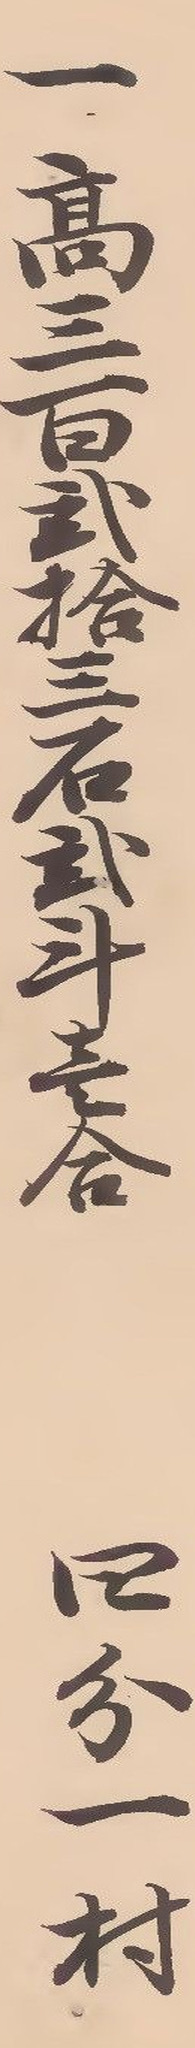一高三百弐拾三石弐斗壱合四分一村

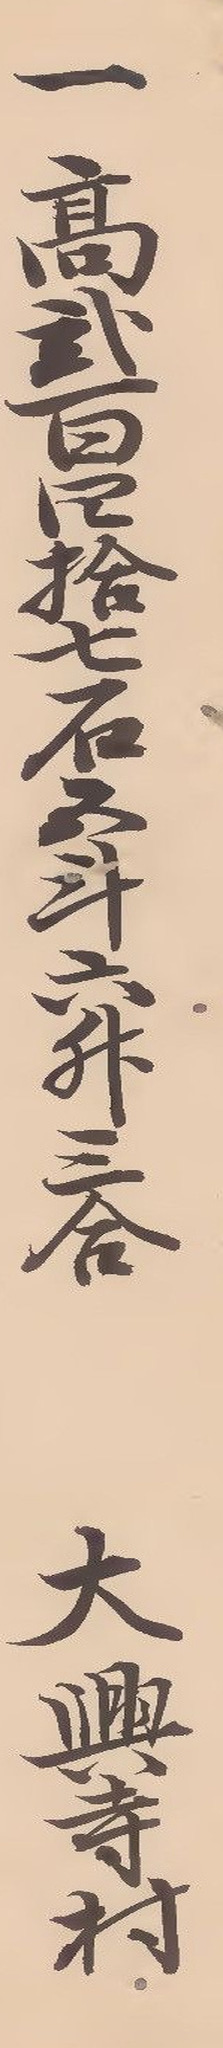一高弐百四拾七石五斗六升三合大興寺村
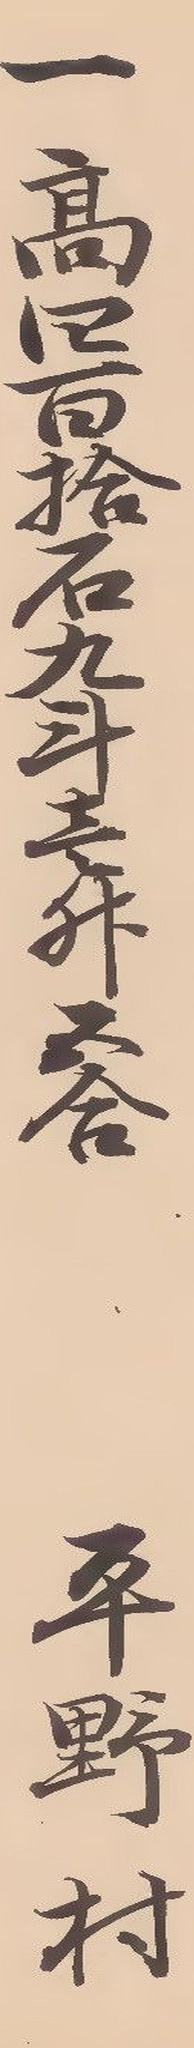一高四百拾石九斗壱升五合平野村
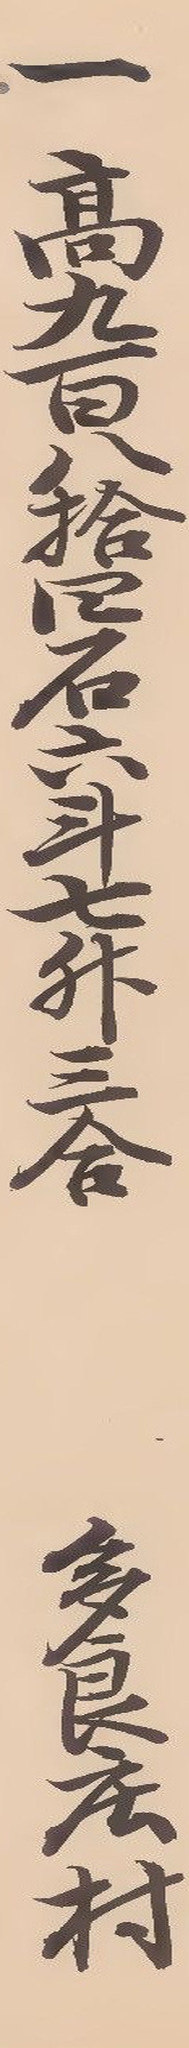一高九百八拾四石六斗七升三合多良庄村
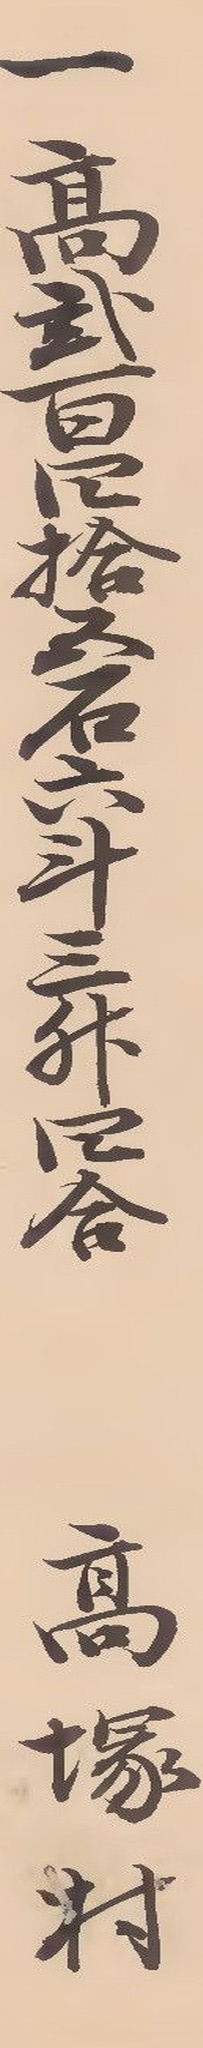一高弐百四拾五石六斗三升四合高塚村
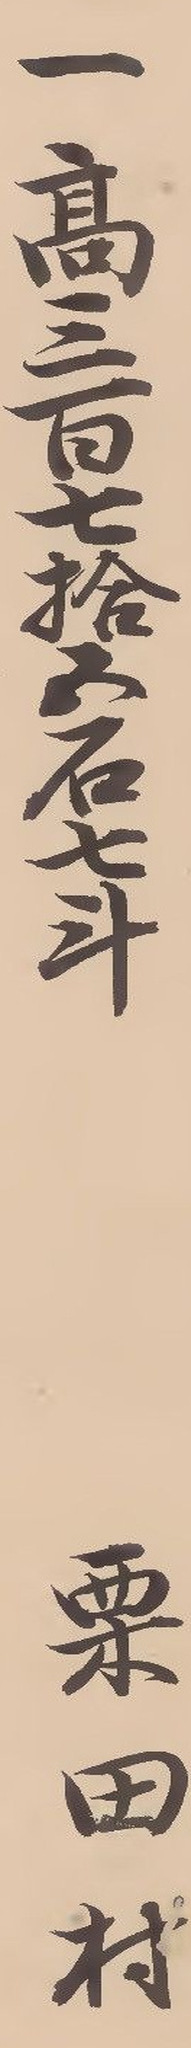一高三百七拾五石七斗栗田村
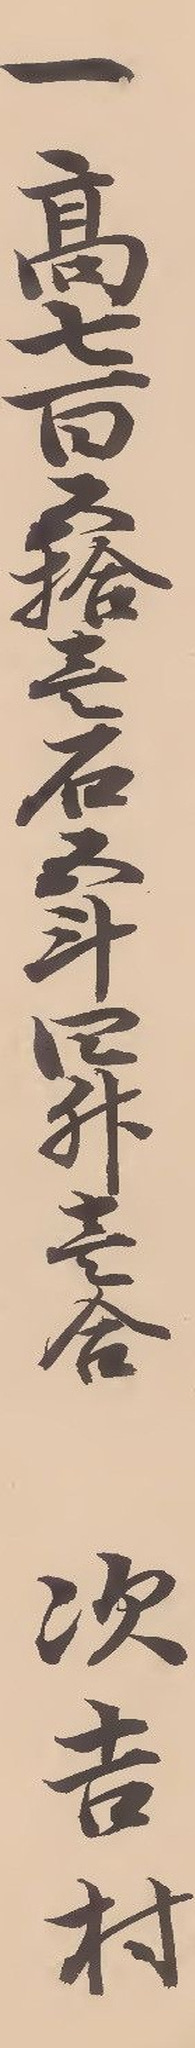一高七百五拾壱石五斗四升壱合次吉村
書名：若狭国郷帳
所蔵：国立公文書館 National Archives of Japan
